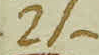21
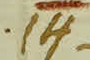14
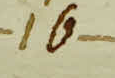16
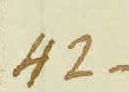42
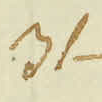31
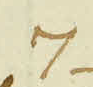7
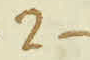2
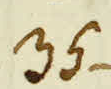35
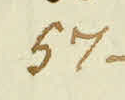57
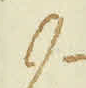9
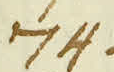74
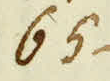65
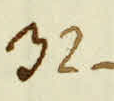32
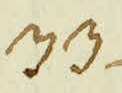33
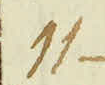11
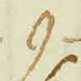9
